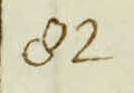82
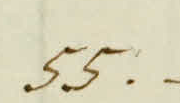55.
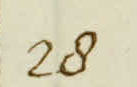28
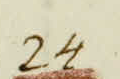24
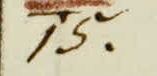15.
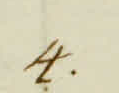4.
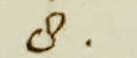8.
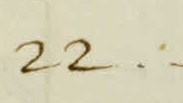22.
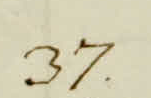37
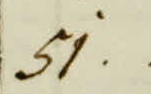51.
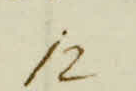12
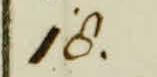18.
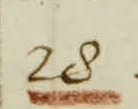28
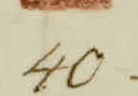40
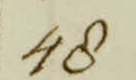48
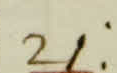21
